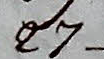27
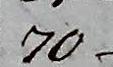70
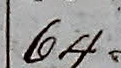64
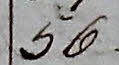56
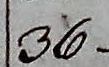36
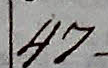47
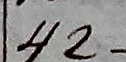42
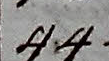44
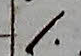1
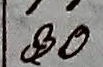30
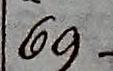69
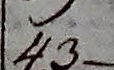43
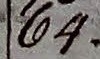64
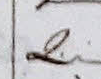2
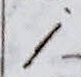1
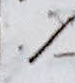1
